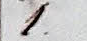1.
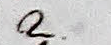2.
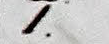1.
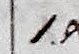1.
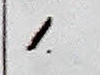1.
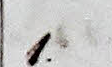1.
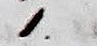1.
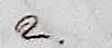2.
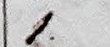1.
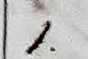1.
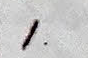1.
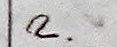2.
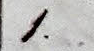1.
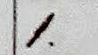1.
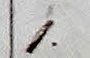1.
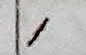1
